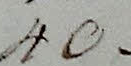40
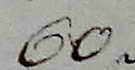60
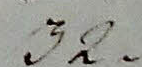32
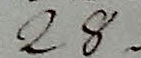28
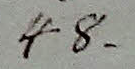48
